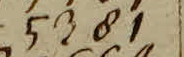5381
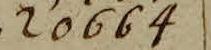20664
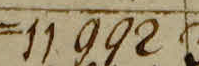11992
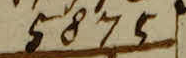5875
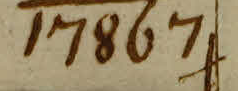17867
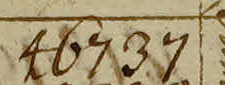46737
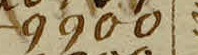9900
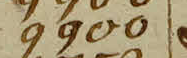9900
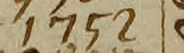1752
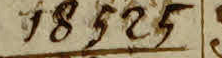18525
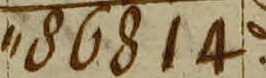86814
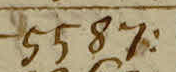5587
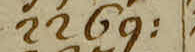2269:
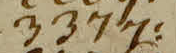3377
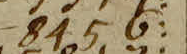8456
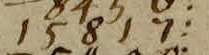15817
